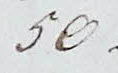50
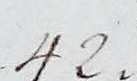42
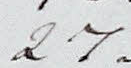27
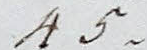45
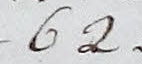62
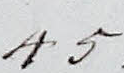45
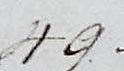49
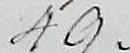49
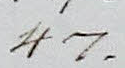47
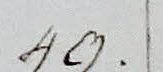49
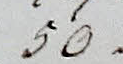50
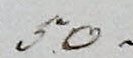50
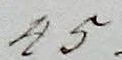45
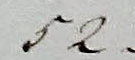52
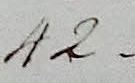42
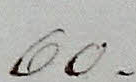60
